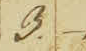3.
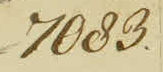7083.
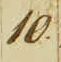10.
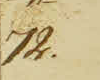72.
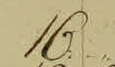16.
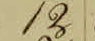12
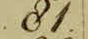81.
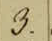3.
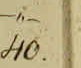40.
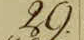29.
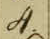4.
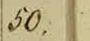50.
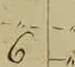6.
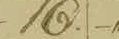16.
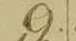9.
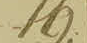19.
